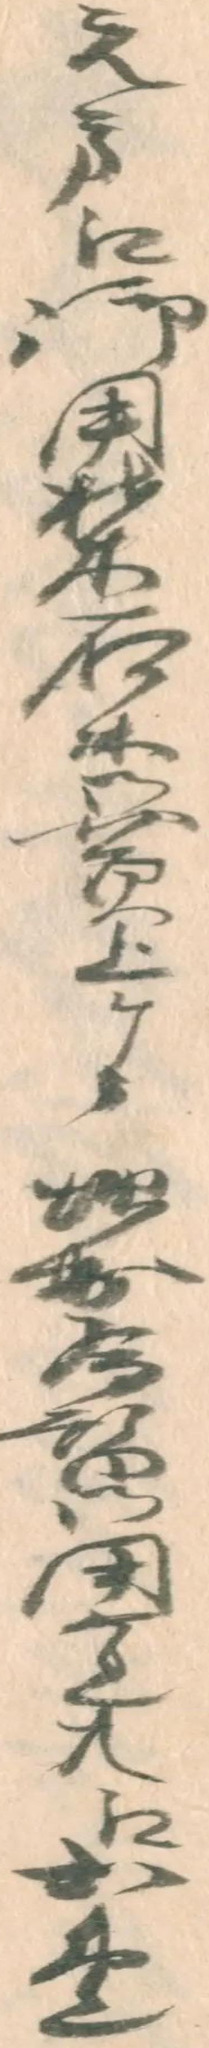元方え御用材木石等御買上ケ被仰出為替御用達共え出金
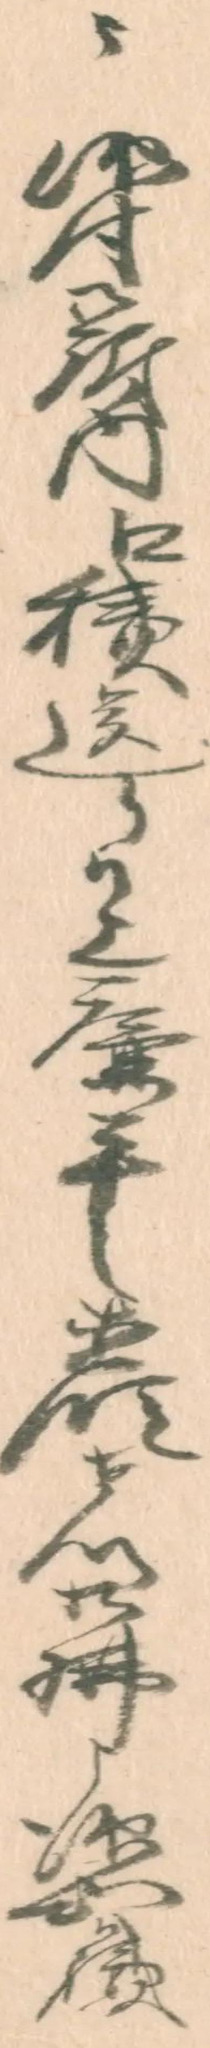被仰付御府内え積送り候上廉平之直段を以御払被仰出候積
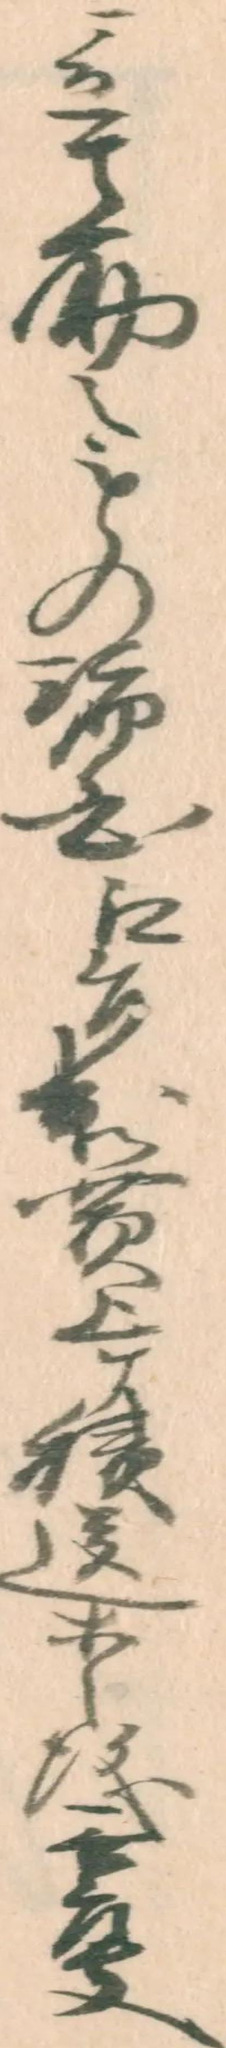ニて其筋のもの諸国え差出御買上ケ積送等之儀無差支
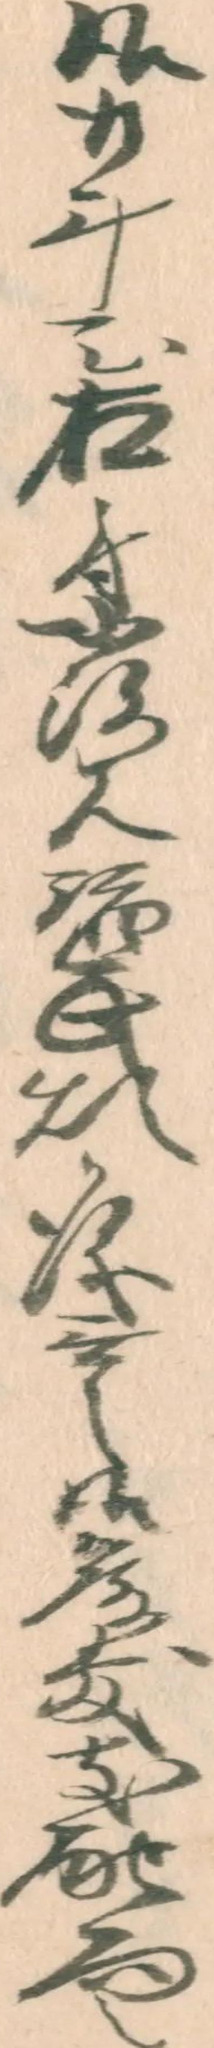様取計尤右ニ付出役人諸民煩候儀無之様厳敷支配向之
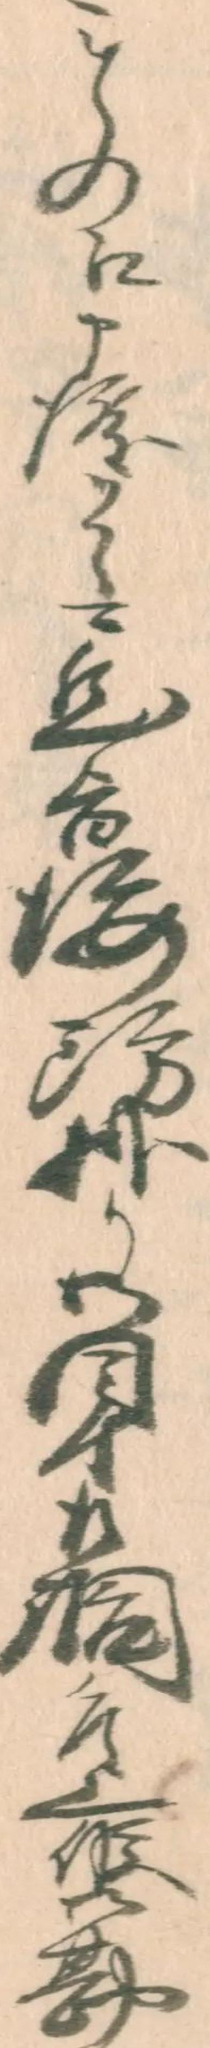ものえ申渡候ハヽ可宣旨海防掛御目付取調差上候御勘
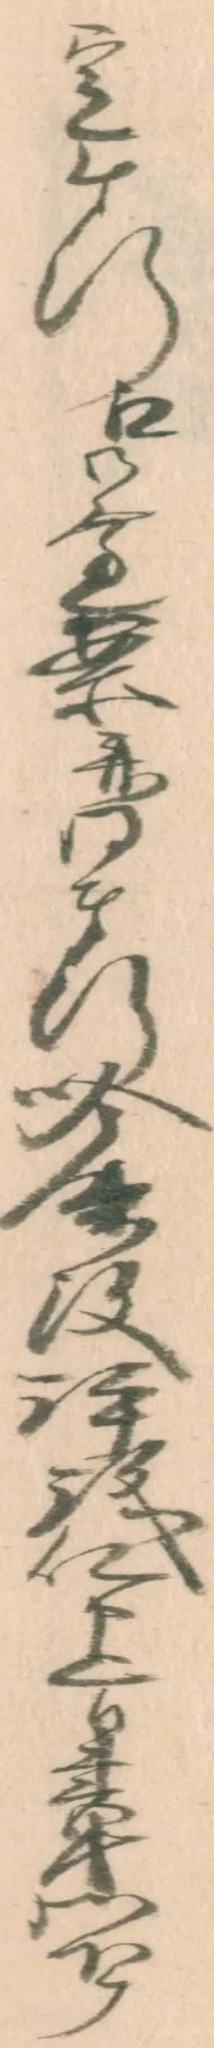定奉行え御達案幷同奉行吟味役評議仕申上候書付御下ケ
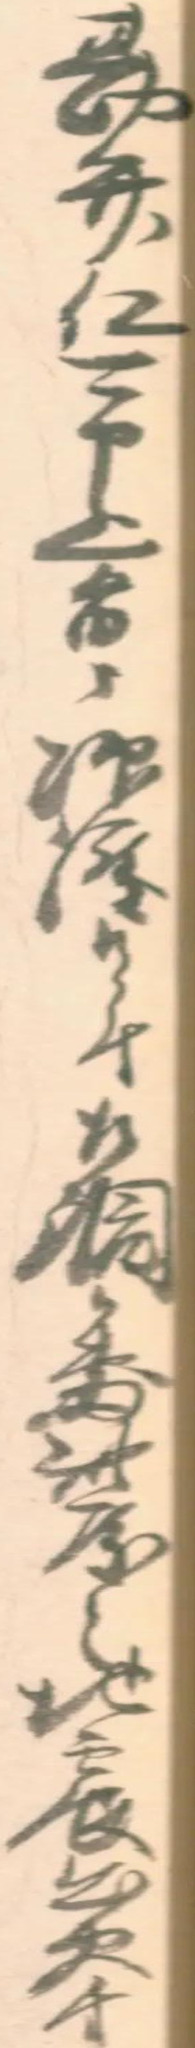勘弁仕可申上旨被仰渡候ニ付取調候処此度之地震出火ニ付
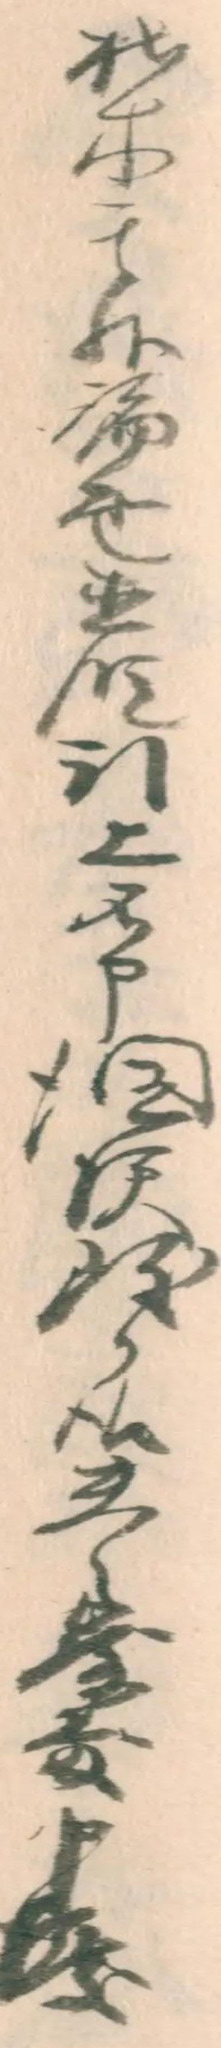材木其外諸色直段引上不申潤沢致候様夫〻厳敷申渡
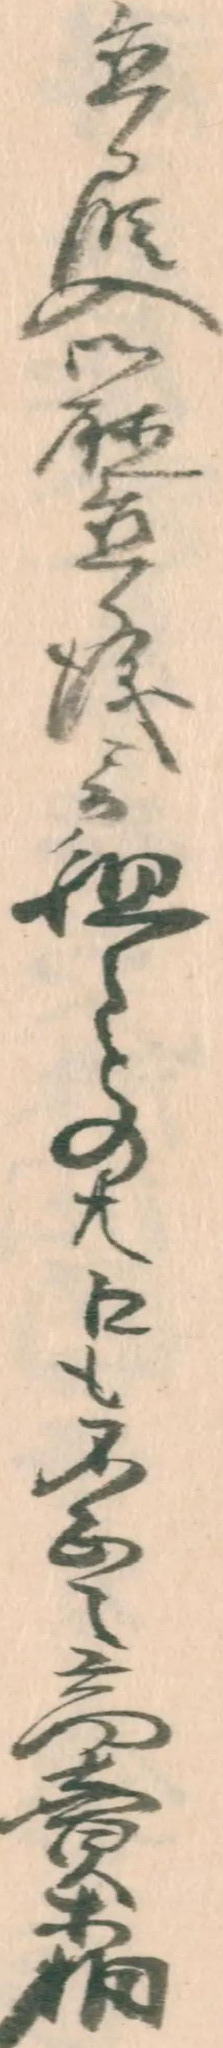置候段入御聴置候儀ニて組〻もの共えも不正之高売等相
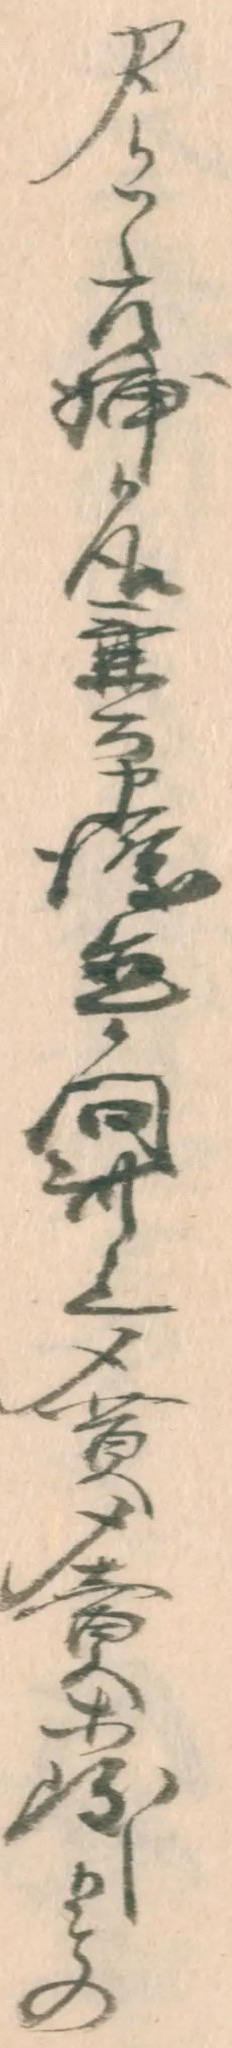聞候ハヽ召捕候様兼て申渡置候間此上〆買〆売等致候もの
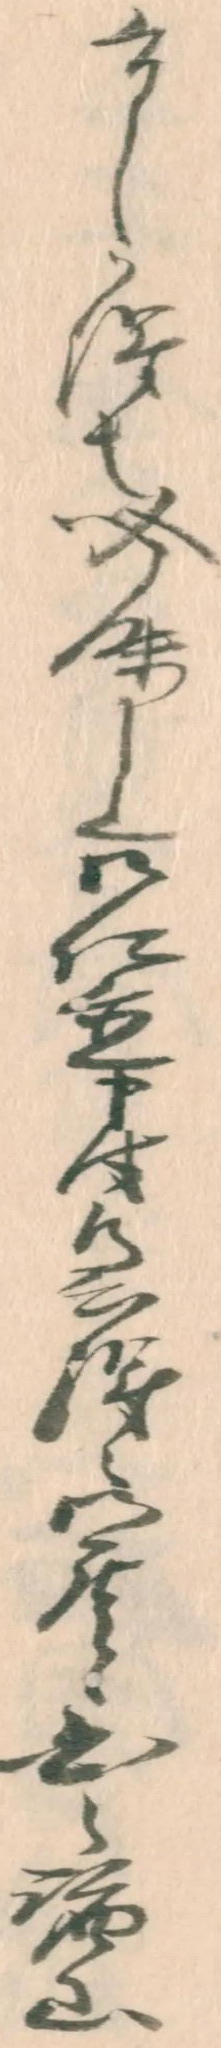有之候得は吟味之上仕置申付候心得ニ御座候国〻諸山
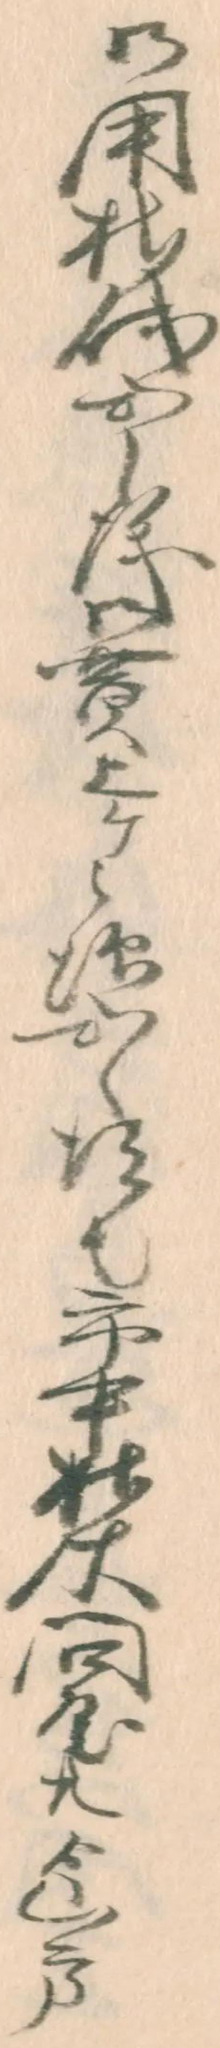御用材伐出之儀御買上被仰出候得は市中材木問屋共ゟ山方
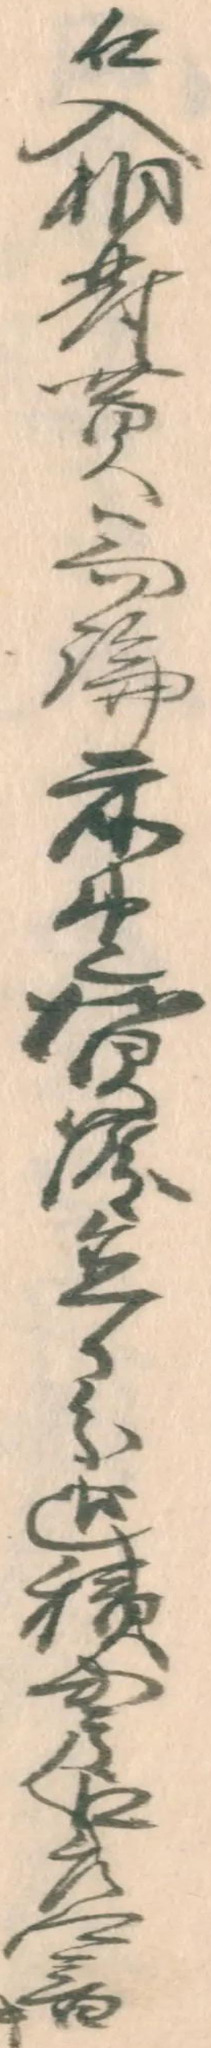え入相対買ハ勿論前金貸渡置候分迄積出及迄差響キ
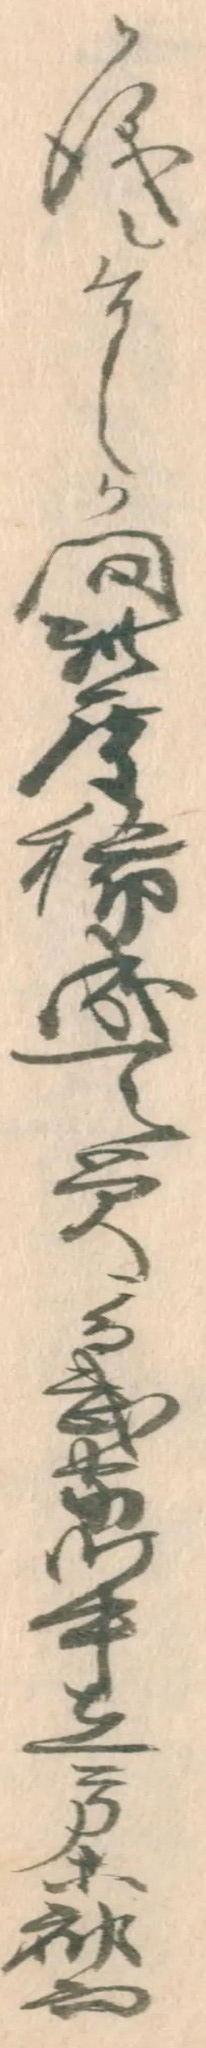候儀ニ有之候間此度稀成天災ニて武家町中在方等都て

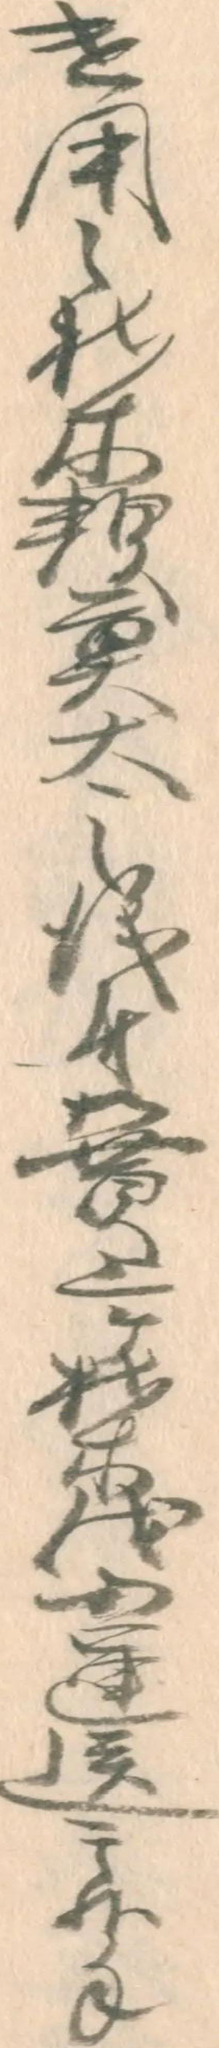遣用の材木類莫大之儀付御買上ケ材木伐出運送其外手
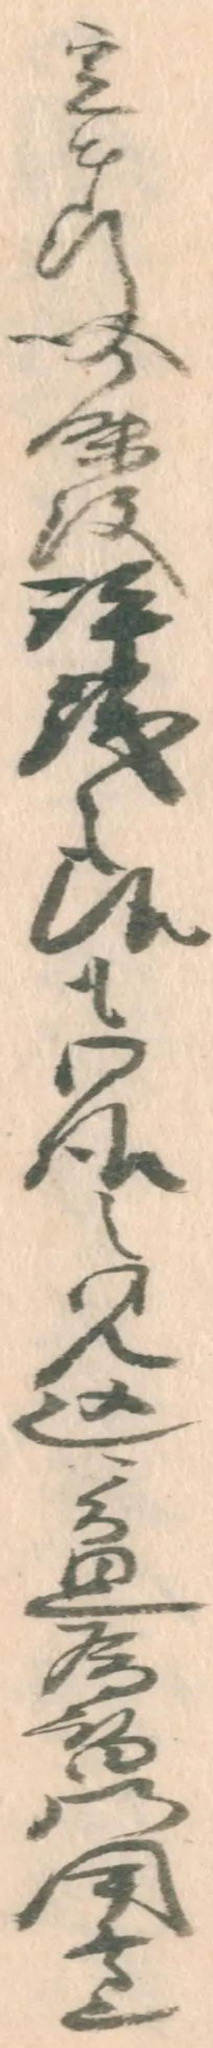定奉行吟味役評議之趣も同様之見込ニて且為替御用達
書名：地震災書留 2巻. [2] 内表紙に「地震一件　安政二卯年十月」とあり
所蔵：国立国会図書館 National Diet Library, JAPAN
